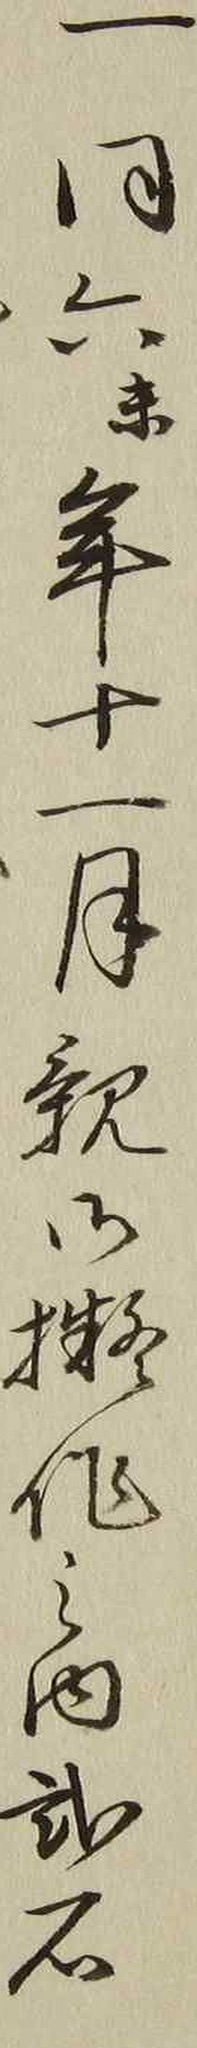一同六未年十一月親御擬作之内弐石
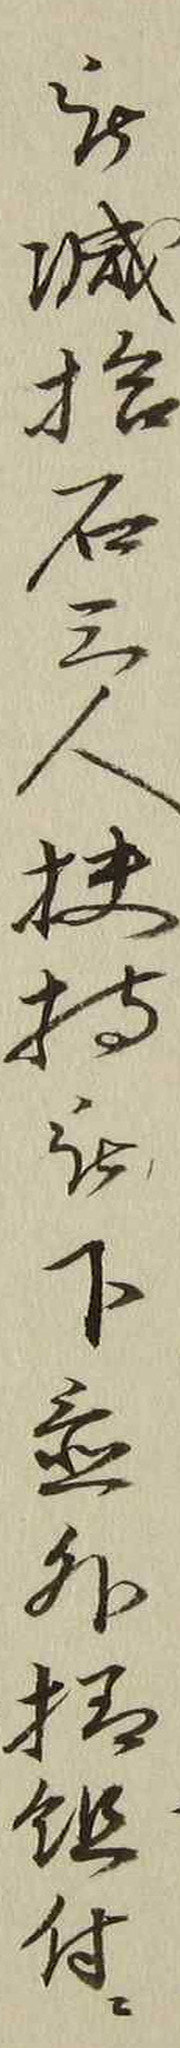被減拾石三人扶持被下置外様組付二
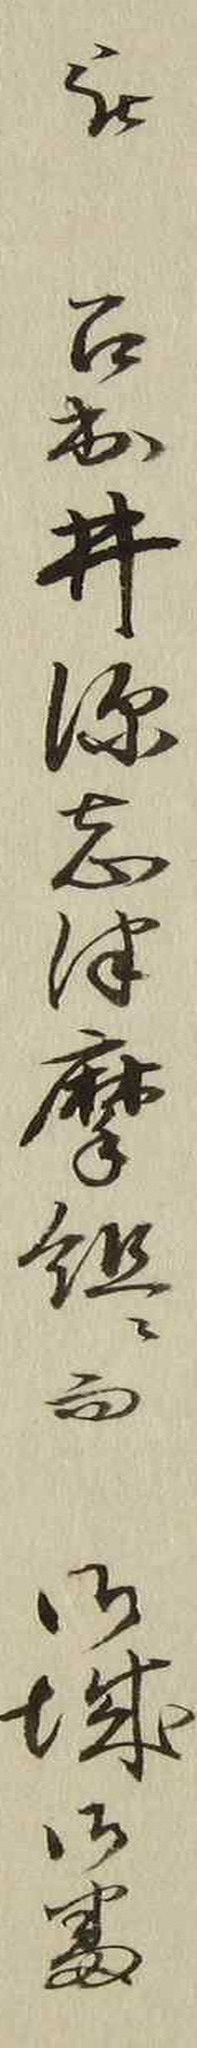被召出井沢志津摩組ニ而御城御番
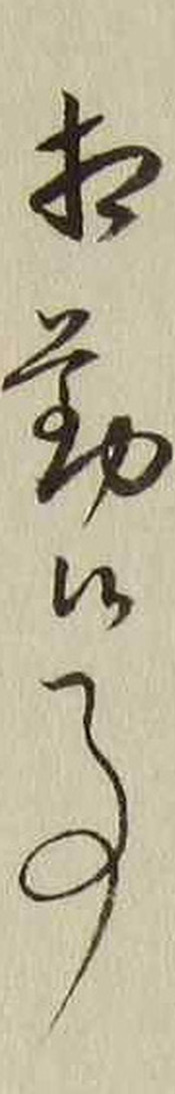相勤候事
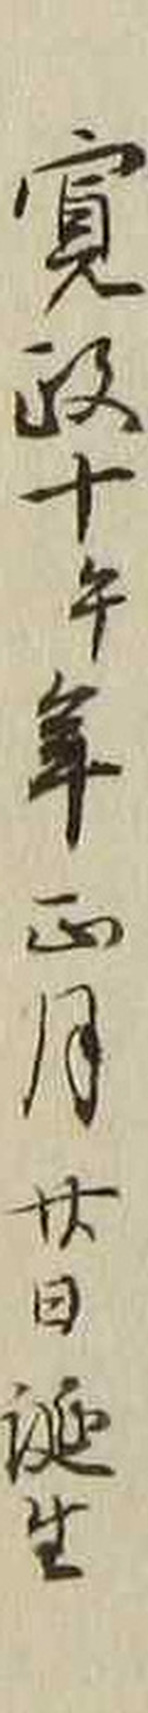女寛政十午年正月廿日誕生
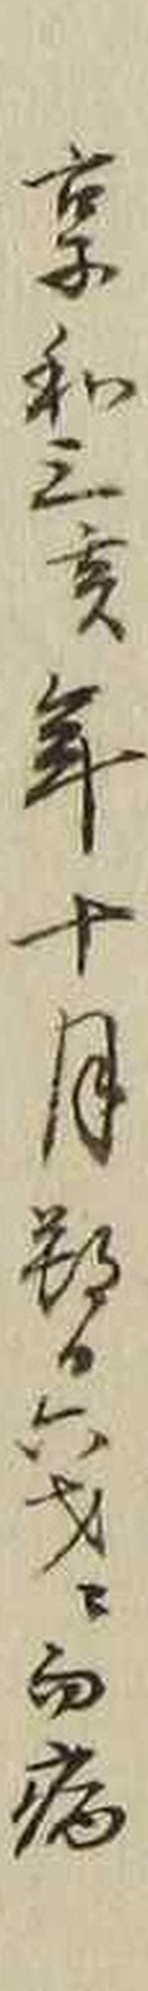享和三亥年十月朔日六才ニ而病
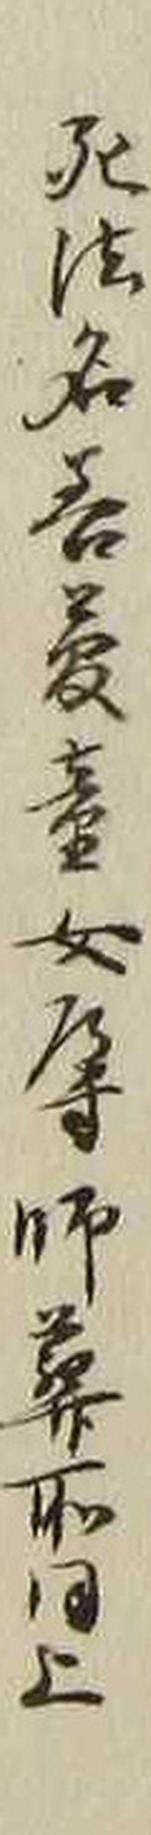死法名善夢童女導師葬所同上
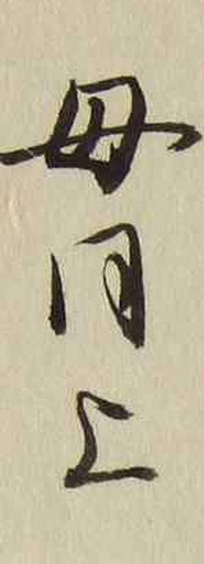母同上

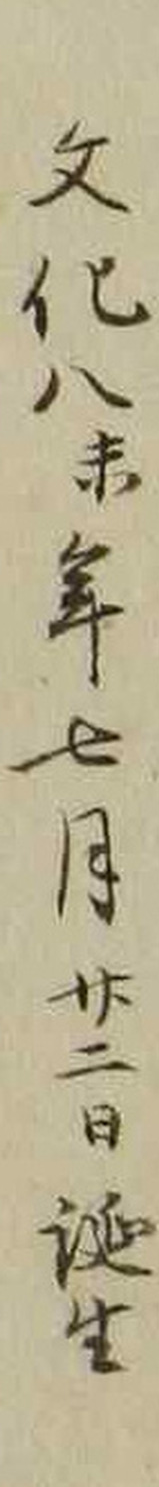女文化八未年七月廿二日誕生
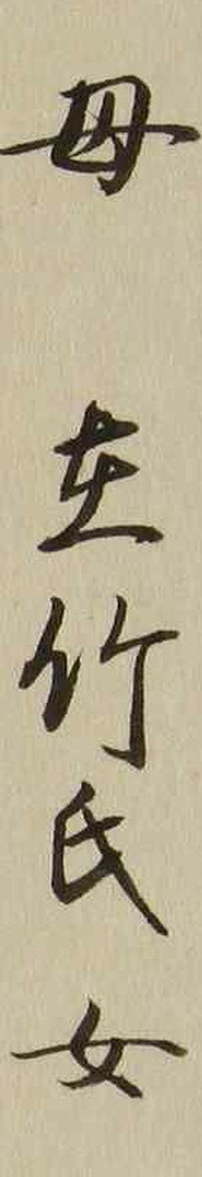母在竹氏女
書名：諸士系譜　巻之114　か之部22
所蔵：会津若松市立会津図書館
